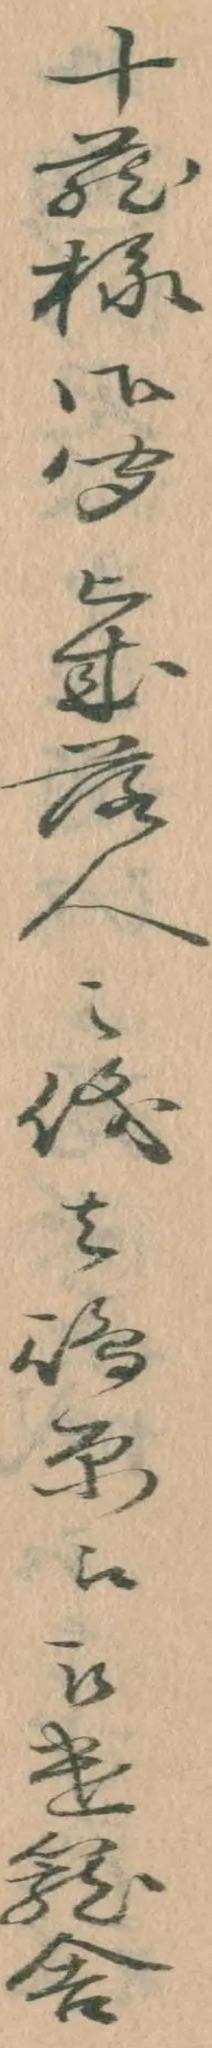十蔵様御聞被成落人之儀者島原江被遣籠舎
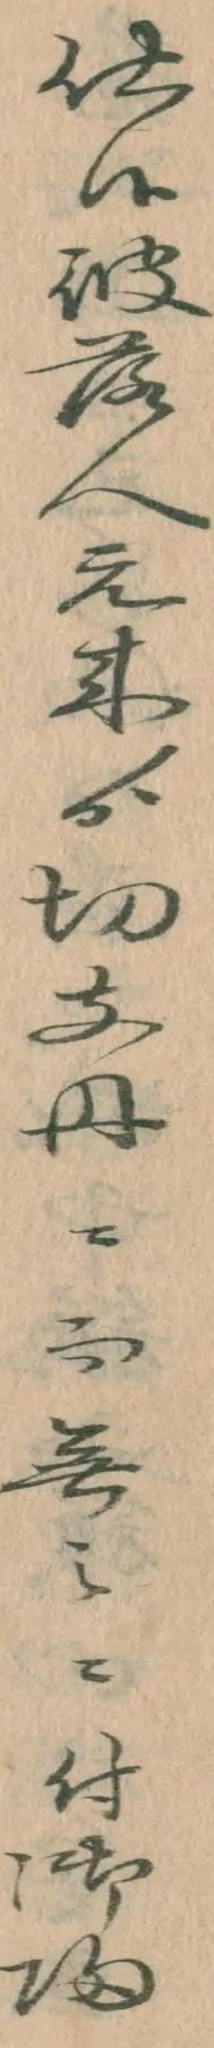仕候彼落人元来ゟ切支丹に而無之に付御帰
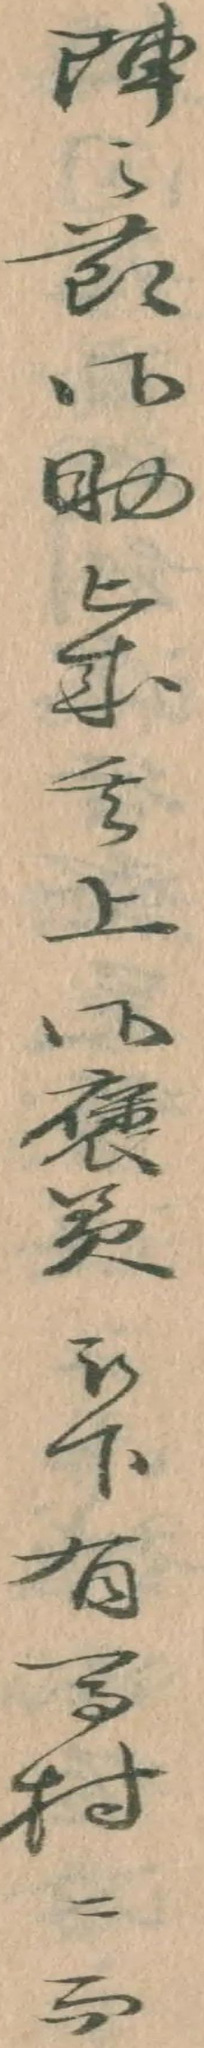陣之節御助被成其上御褒美被下有馬村に而
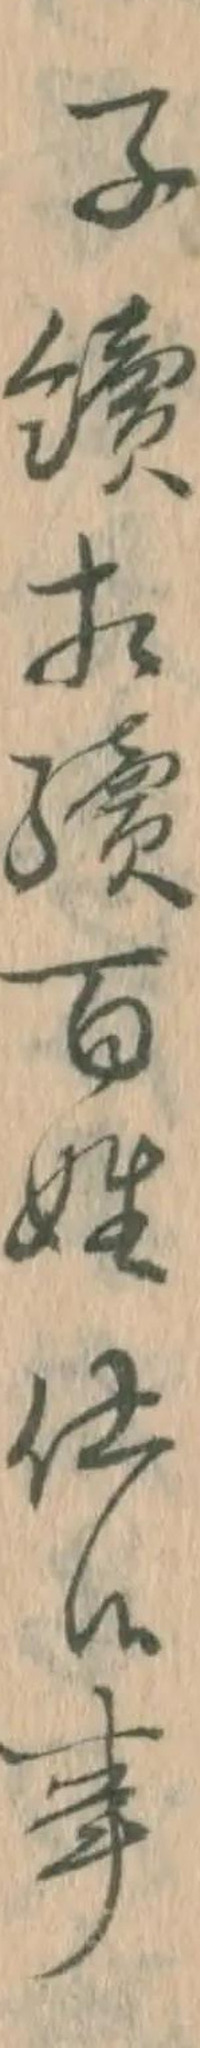子続相続百姓仕候事
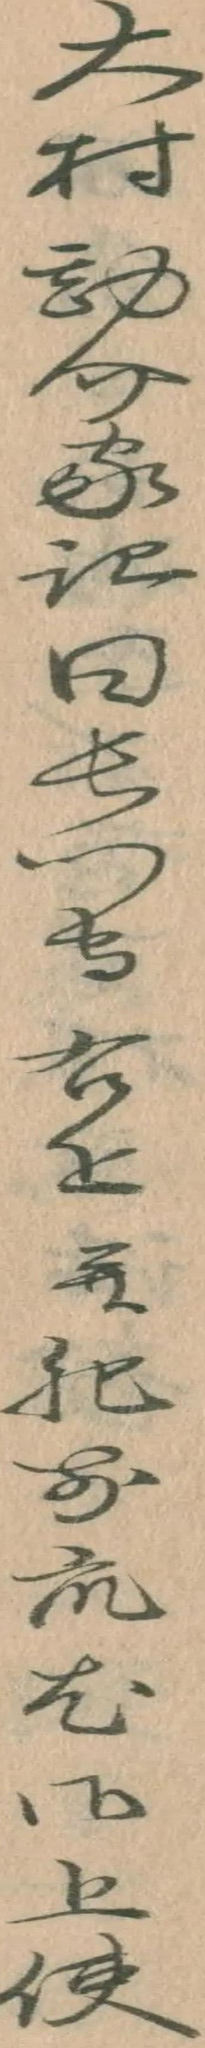大村勘介家記曰長門守右近幷肥前衆尤御上使
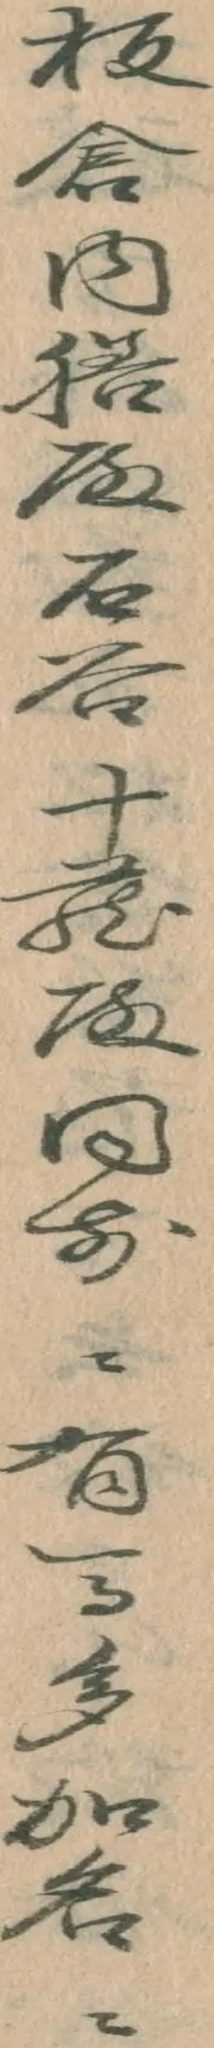板倉内膳殿石谷十蔵殿同前に有馬多加名に
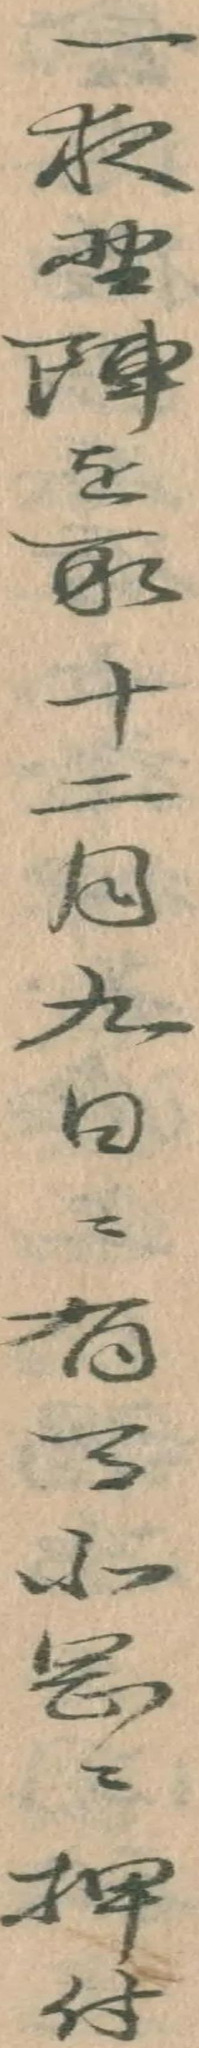一夜野陣を取十二月九日に有馬北岡に押付
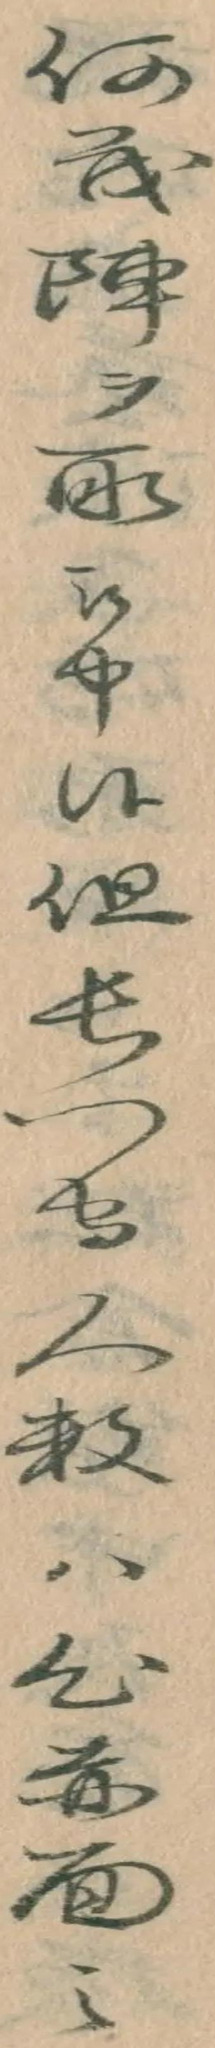何茂陣を取被申候但長門守人数は心赤面之
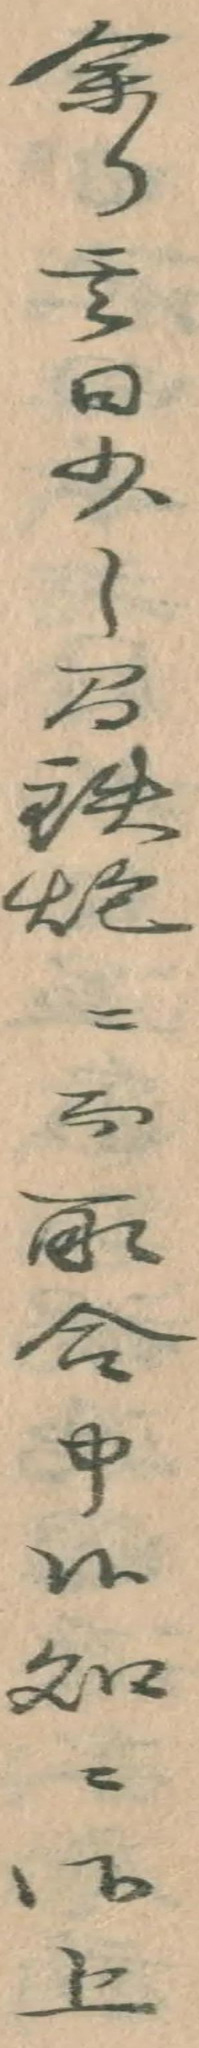余り其日少し間鉄炮に而取合申候処に御上
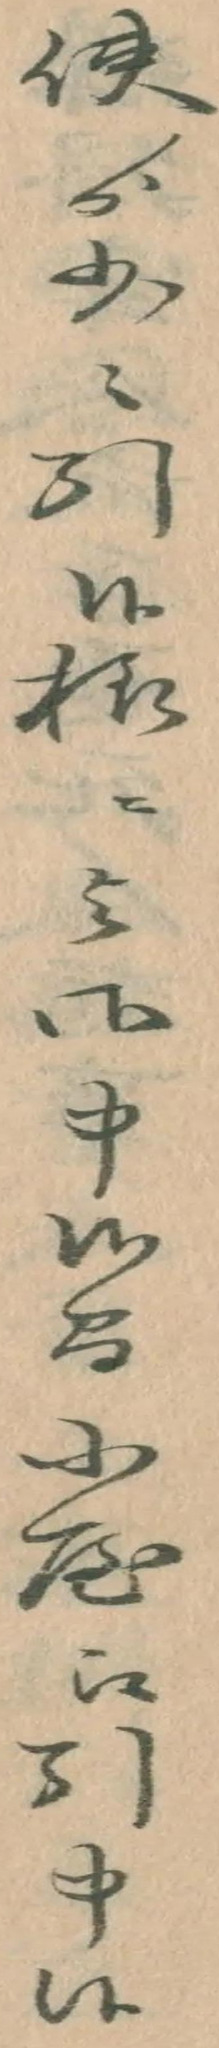使ゟ少々引候様に与御申候間小屋江引申候

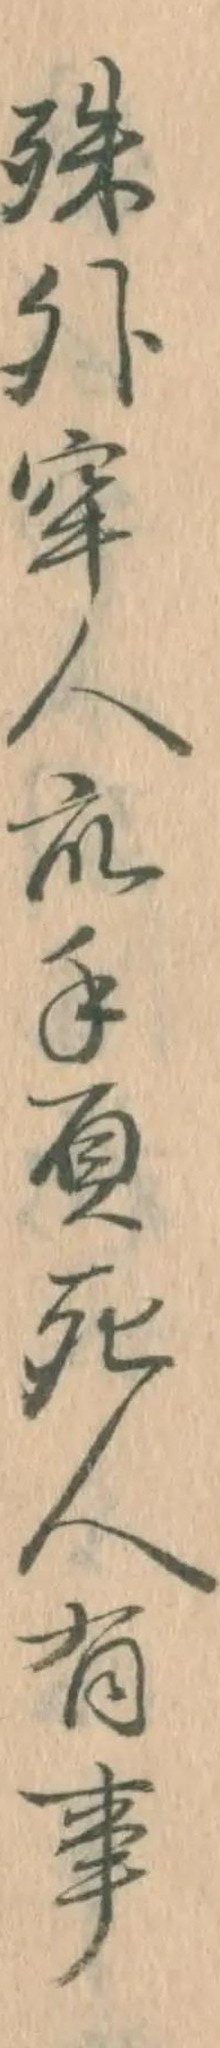殊外牢人衆手負死人有事
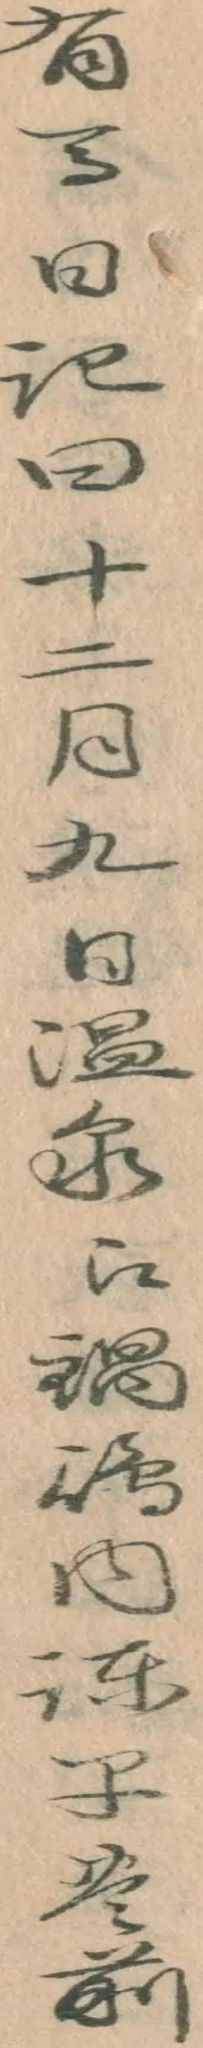有馬日記曰十二月九日温泉江鍋島内諫早豊前
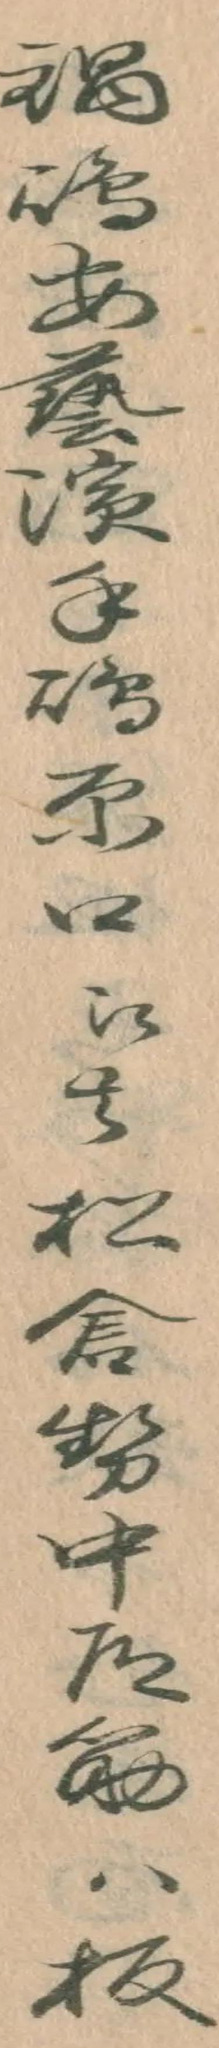鍋島安芸浜手島原口江者松倉勢中道筋は板
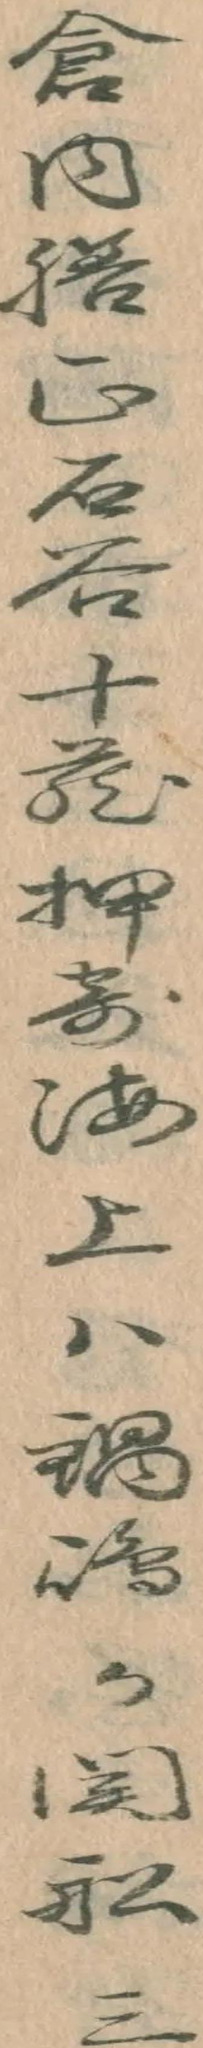蔵内膳正石谷十蔵押寄海上は鍋島か関舩三
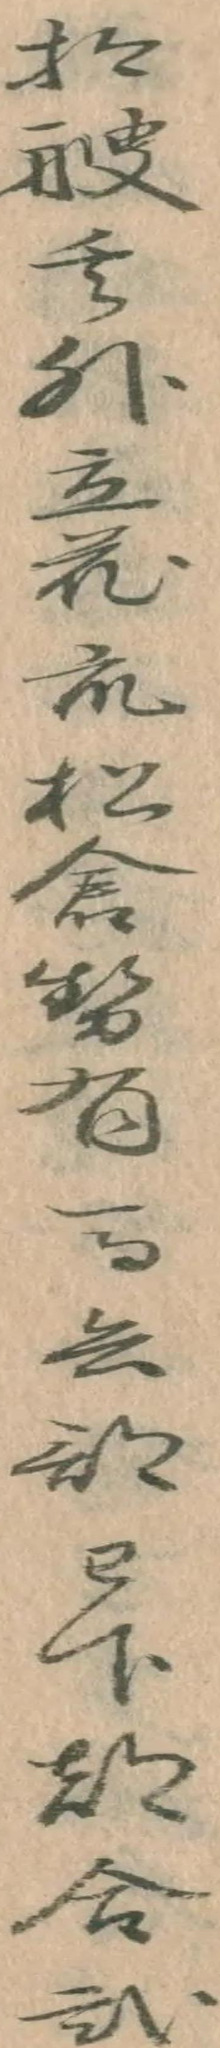十艘其外立花衆松倉勢有馬兵部已下都合弐
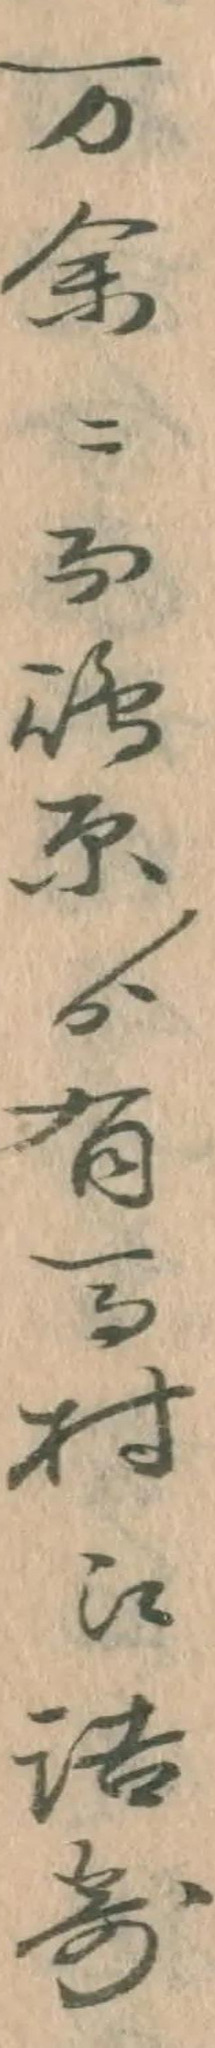万余に而島原ゟ有馬村江詰寄
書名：切支丹御退治記 49巻. [4]
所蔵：国立国会図書館 National Diet Library, JAPAN
